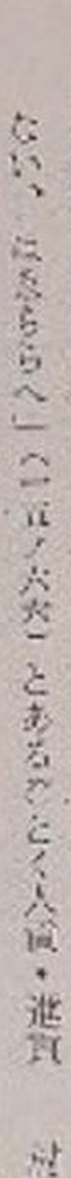ない、はゑらちへ」(一五ノ六六)とあるごとく入貢・進貢
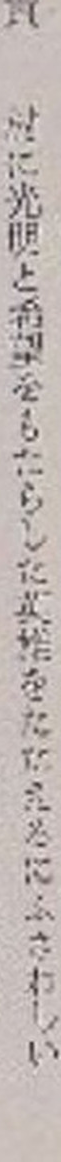村に光明と希望をもたらした英雄をたたえるにふさわしい
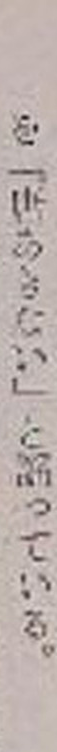を「唐あきない」と謡っている。
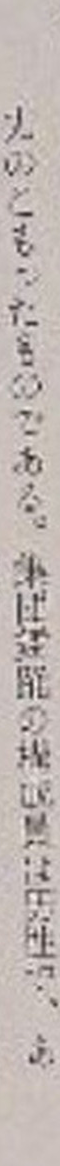のこもったものである。集団舞踊の構成員は男性で、あ
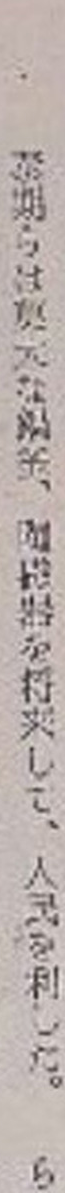泰期らは莫大な鍋釜、陶磁器を将来して、人民を利した。
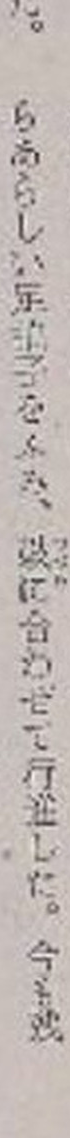らあらしい足拍子をふみ、鼓に合わせて行進した。今も残
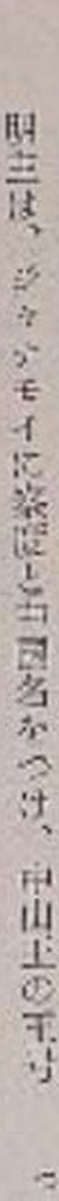明王は、ジャナモイに察度と中国名をつけ、中山王の王号
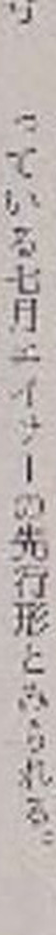っている七月エイサーの先行形とみられる。
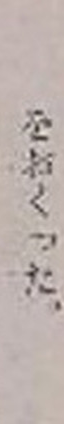をおくった。
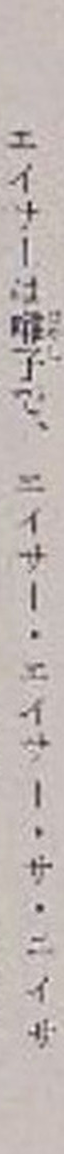エイサーは囃子で、エイサー・エイサー・サ・ニイサ
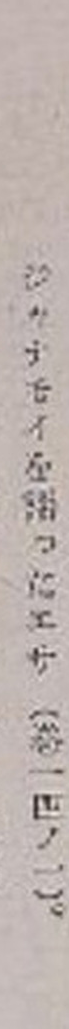ジャナモイを謡ったエサ(巻一四ノ一)。
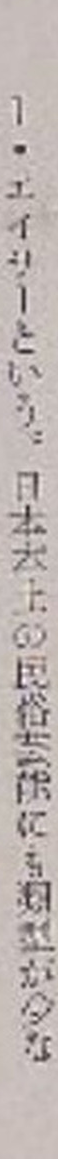ー・エイサーという。日本本土の民俗芸能にも類型が少な
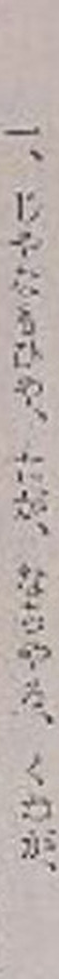一、じやなもひや、たが、なちやる、くわが、
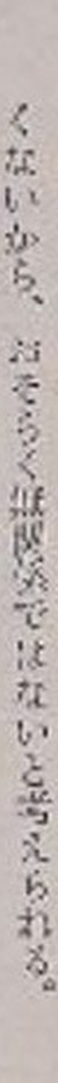くないから、おそらく無関係ではないと考えられる。
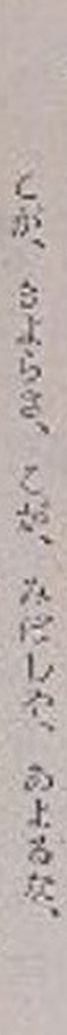こが、きよらさ、こが、みぼしや、あよるな、
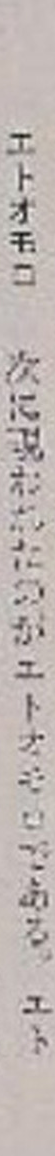エトオモロ次に現われたのがエトオモロである。エト
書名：沖縄口承文芸
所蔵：University of the Ryukyus Library
